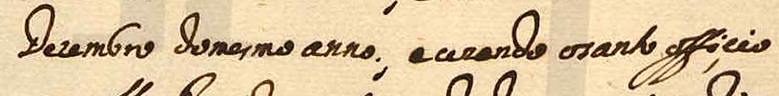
Dezembro do mesmo anno; e uzando o santo officio
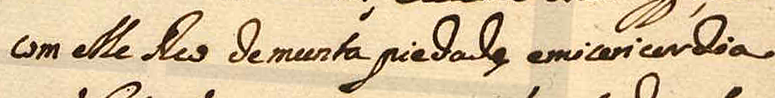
com elle Reo de munta piedade, e misericordia
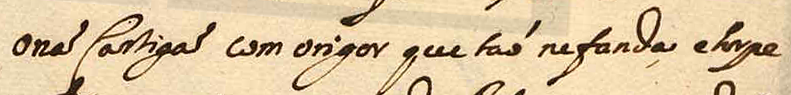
o naõ Castigaõ com o rigor que taõ nefanda, e torpe
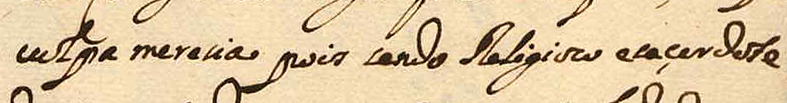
culpa merecia pois sendo Religiozo e sacerdote
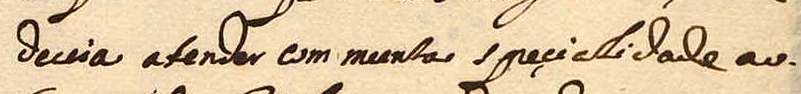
deuia atender com munta specialidade a o
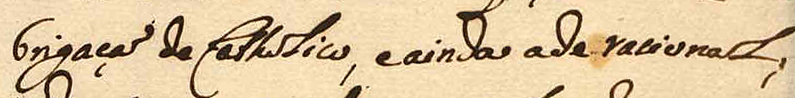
brigaçaõ de Catholico, e ainda a de racionaL;
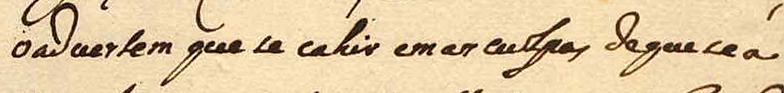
o aduertem que se cahir em as culpas de que ce a
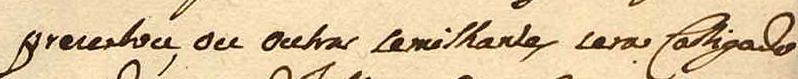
prezentou, ou outras semilhantes sera Castigado
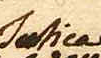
Iustiça
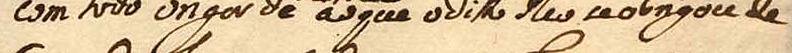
com todo o rigor de ao que o ditto Reo se obrigou de
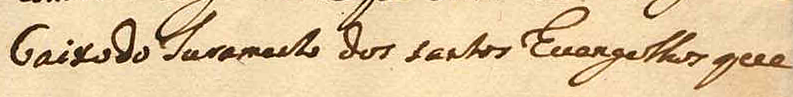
baixo do Iuramento dos santos Euangelhos que
